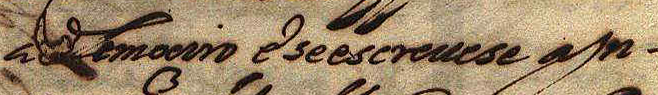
ao Lemoeiro e se escreuese a Jn
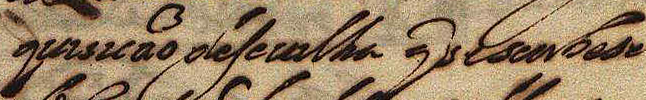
quisiçaõ de seuilha q̄ se soubese
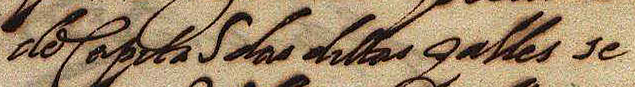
do Capitaõ das dittas galles se
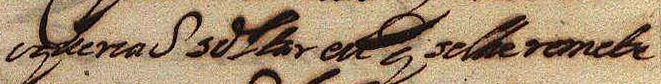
o queriaõ soltar en q̄ se lhe remete
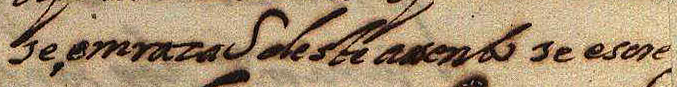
se em razaõ deste assento se escre
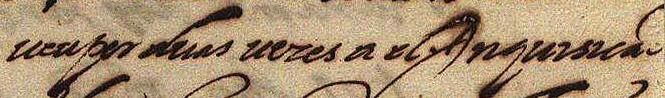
ueu por duas uezes a d̄ Jnquisiçaõ
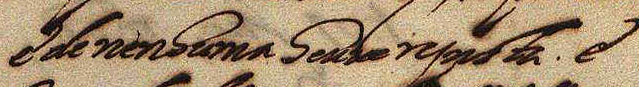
e de nenhuma houve reposta. e
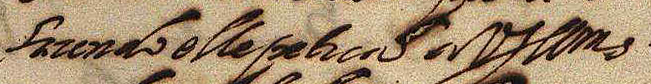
fazendo elle petiçaõ a V Jllma.
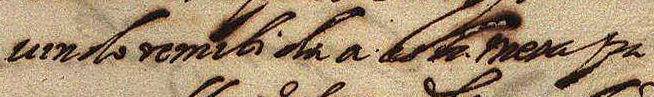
uindo remetida a esta mesa pa
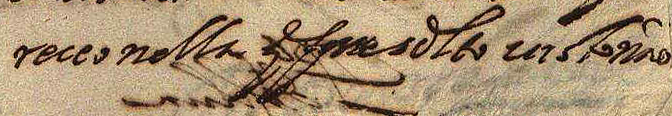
receo nella q̄ fosse solto uisto não
